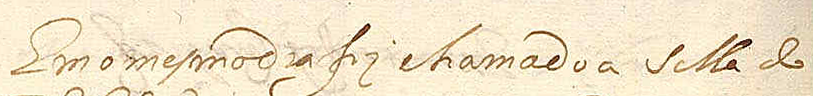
Em o mesmo dia fiz chamado a sella do
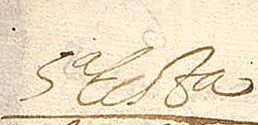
5a testa
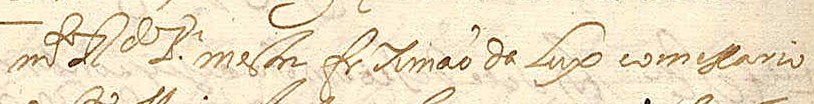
mto Rdo P.e mestre fr simaõ da Lux comissario
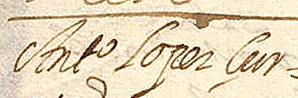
Anto Lopez Cur
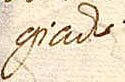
giaõ
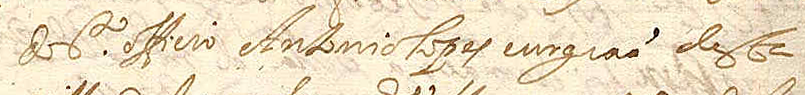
do s.to officio Antonio Lopes curgiaõ desta
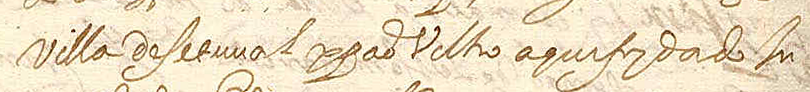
villa de Setuual xpaõ Velho a que foj dado Iu
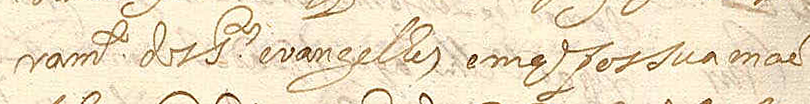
ramto. dos s.tos evangelhos em q̄ pos sua maõ
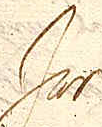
Jur
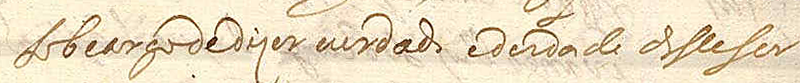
sob cargo de dizer uerdade e de idade disse ser
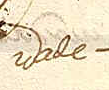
idade -
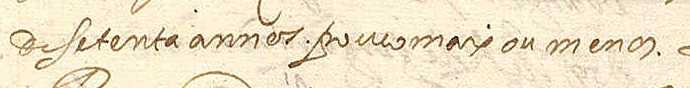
de setenta annos pouco mais ou menos.
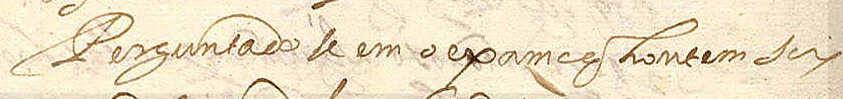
Perguntado se em o exame q̄ hontem seis
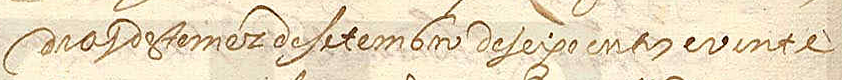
dias deste mez de Setembro de seiscentos e vinte
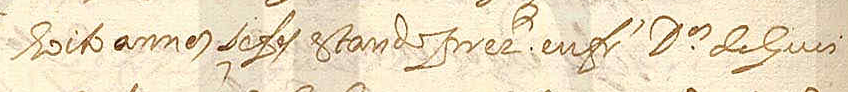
E oito annos se fes estando prez.te eu fr̄ D.os de Quei
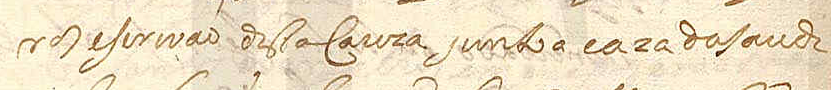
ros escrivaõ desta Cauza junto a caza das audi
